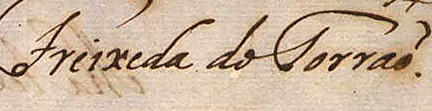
Freixeda do Torraõ
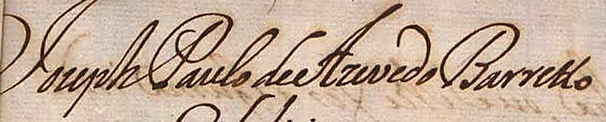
Iozeph Paulo de Azevedo Barretto
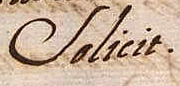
Solicit.
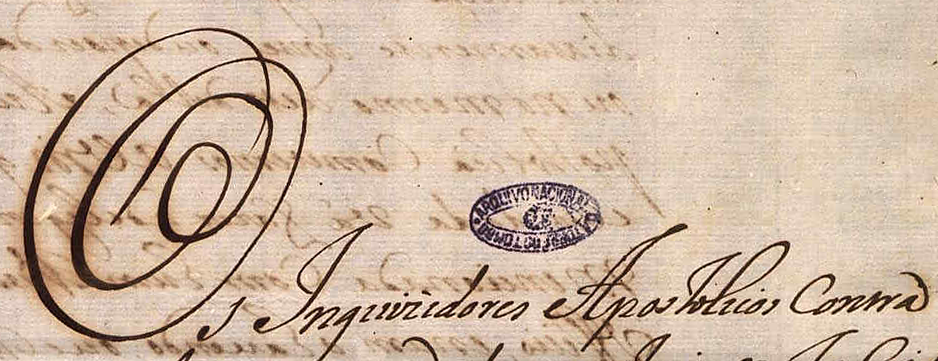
Os Inquizidores Apostolicos Contra
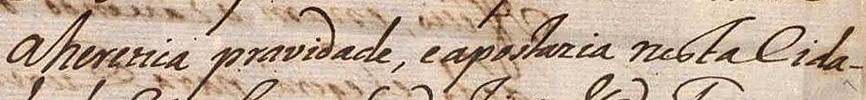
a heretica pravidade, e apostazia nesta Cida
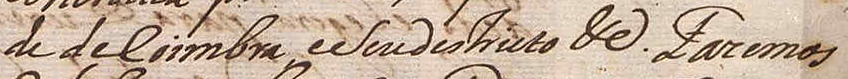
de de Coimbra, e Seu destricto &e. Fazemos
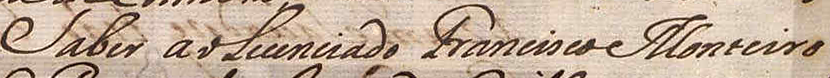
Saber ao Licenciado Francisco Monteiro
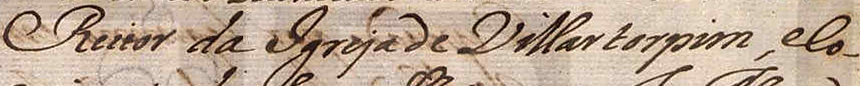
Reitor da Igreja de Villar torpim, e Co
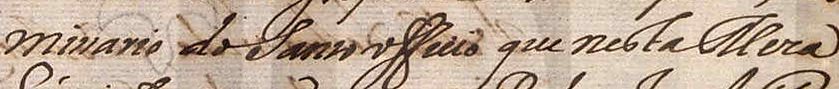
missario do Santo officio que nesta Meza
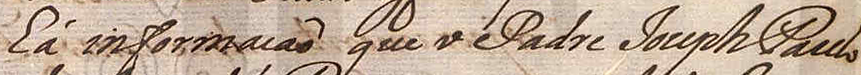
há informaçaõ que o Padre Iozeph Paulo
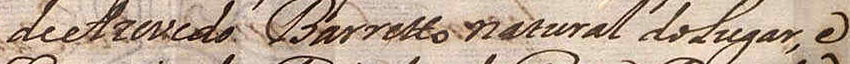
de Azevedo Barretto natural do Lugar, e
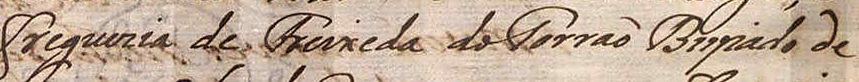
freguezia de Freixeda do Torraõ Bispado de
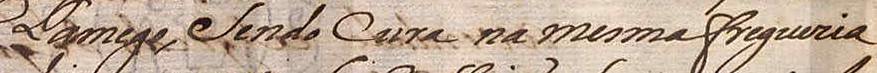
Lamego, Sendo Cura na mesma freguezia
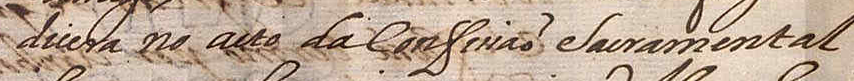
dicera no acto da Confissaõ Sacramental
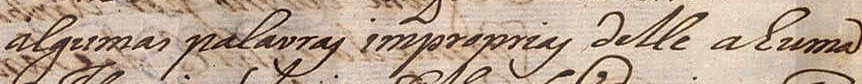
algumas palavras improprias delle a huma
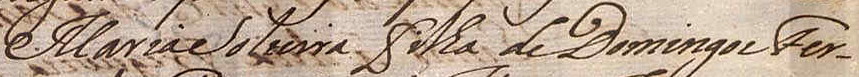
Maria Solteira filha de Domingos Fer
